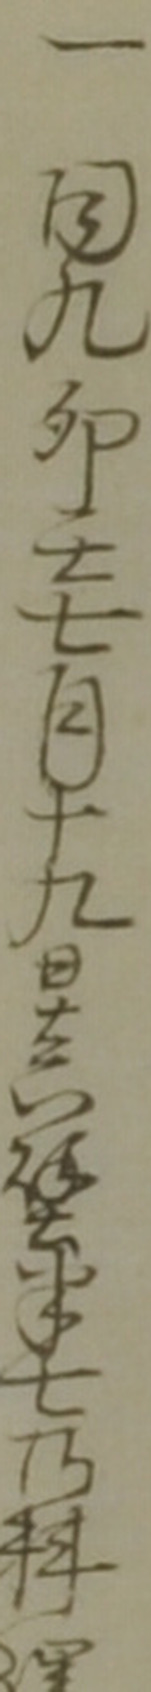一同九卯閏七月十九日真壁半七尾料理方
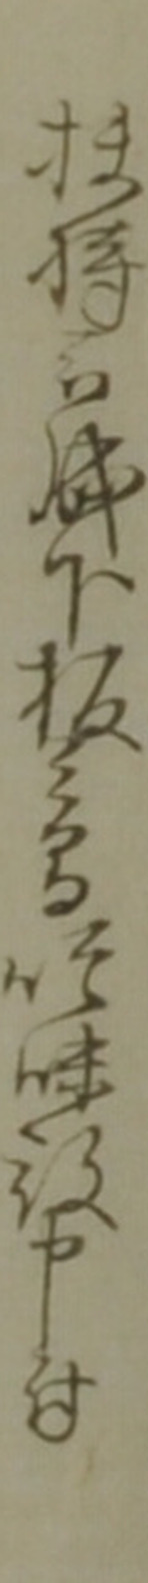扶持被成下板之間吟味役申付
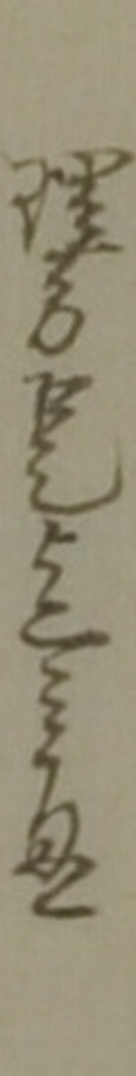理方是迄之通
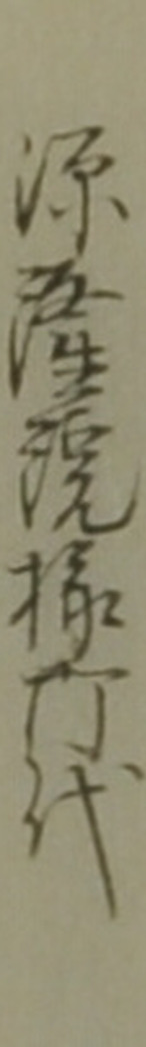源隆院様御代
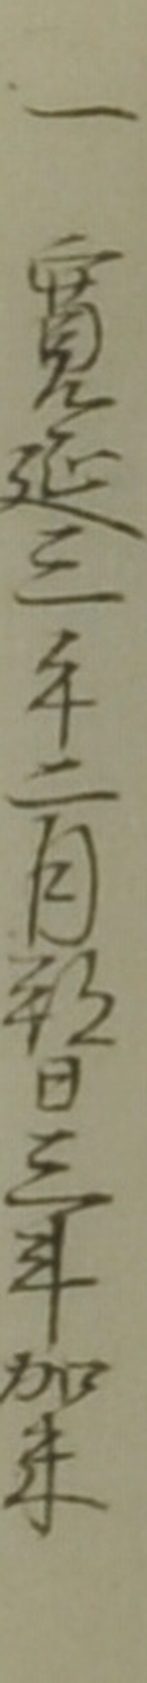一寛延三午二月朔日三斗加米
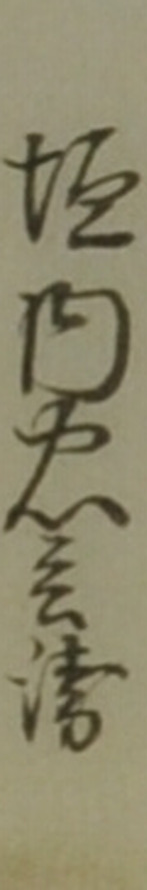垣内忠兵衛
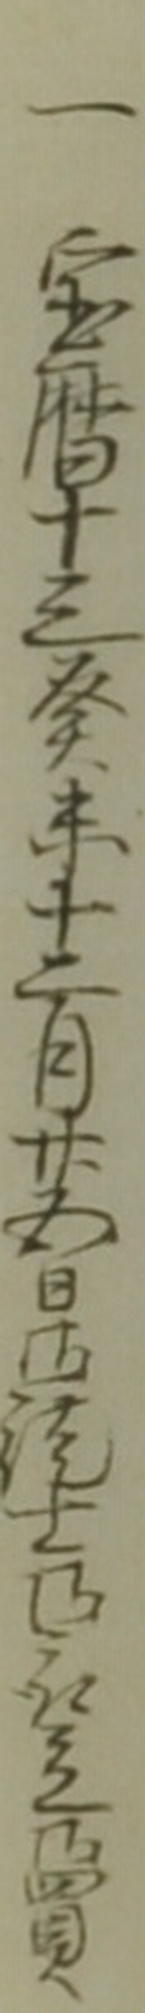一宝暦十三癸未十二月廿五日御徒士御取立御買

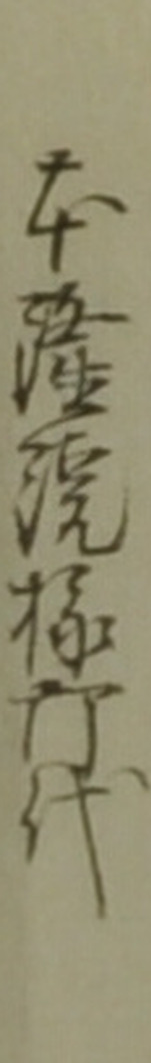本隆院様御代
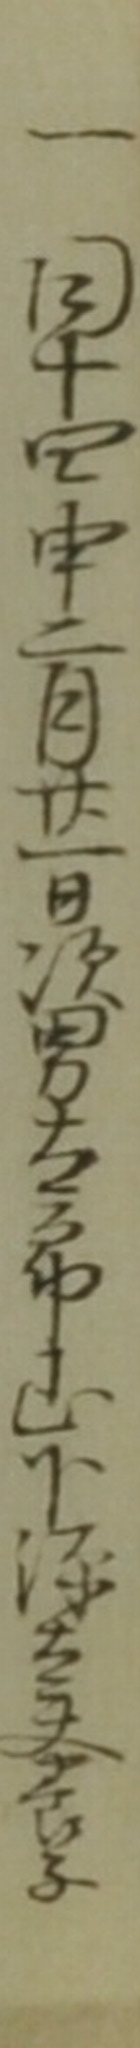一同十四申二月廿一日次男太郎山下深太夫養子
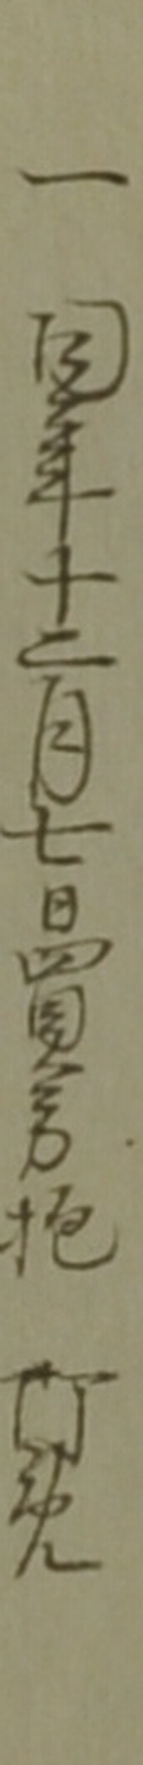一同年十二月七日買方抱御免
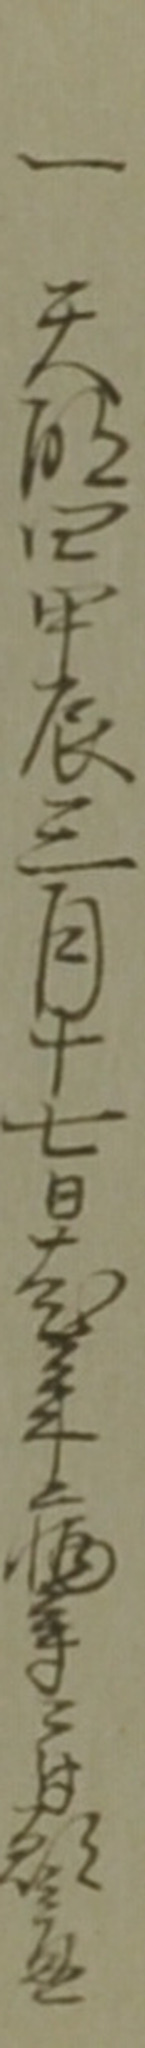一天明四甲辰三月十七日老年病気ニ付願之通
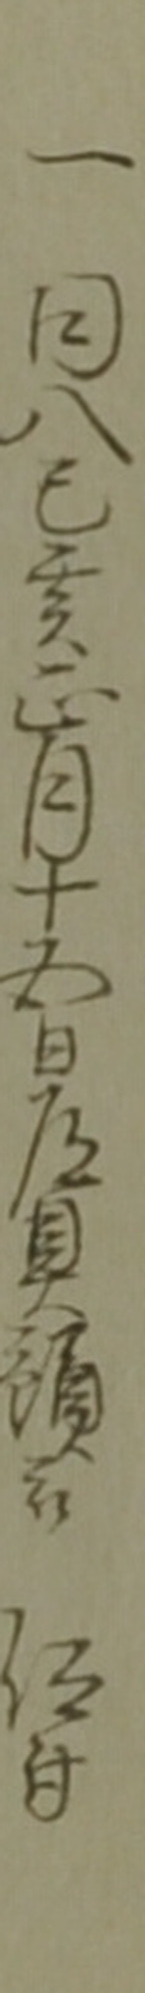一同八己亥正月十五日道具預被仰付
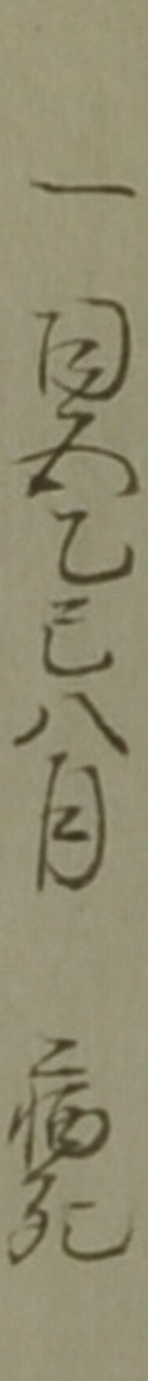一同五乙巳八月病死
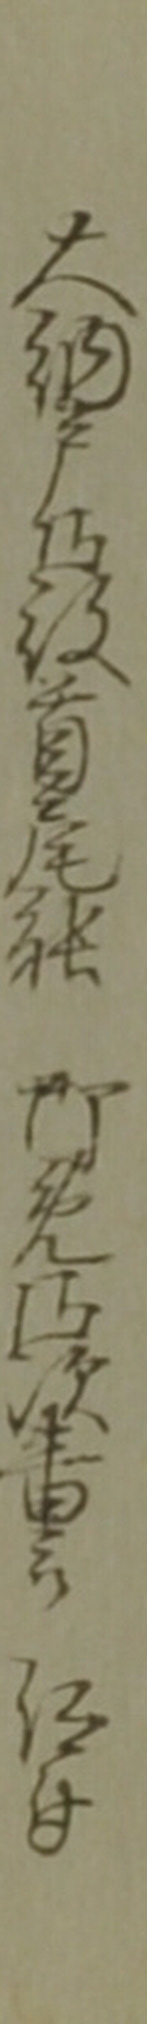大納戸御役首尾能御免御次番被仰付
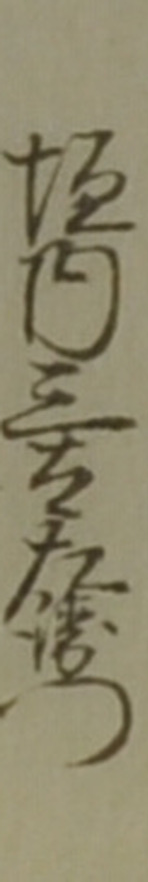垣内三太左衛門
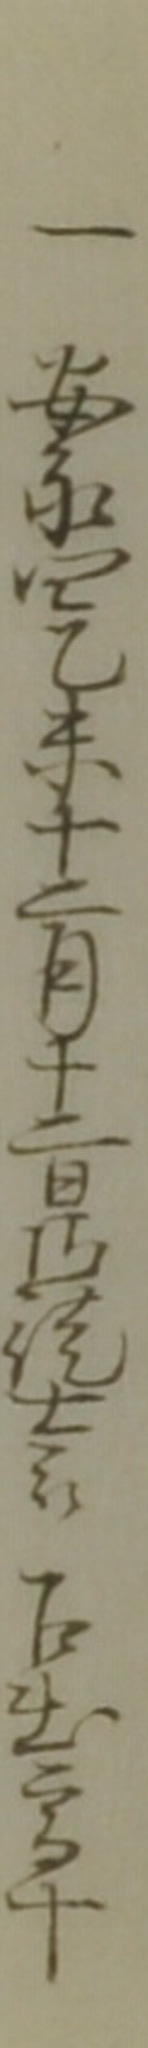一安永四乙未十二月十二日御徒士被召出高十
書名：無足廃家（壱）
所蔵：伊那市立高遠町図書館・合同会社AMANE
